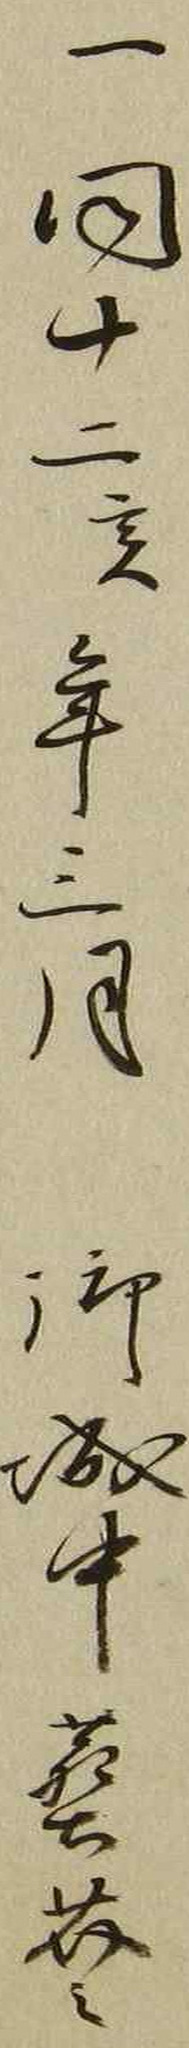一同十二亥年三月御城中塵芥之
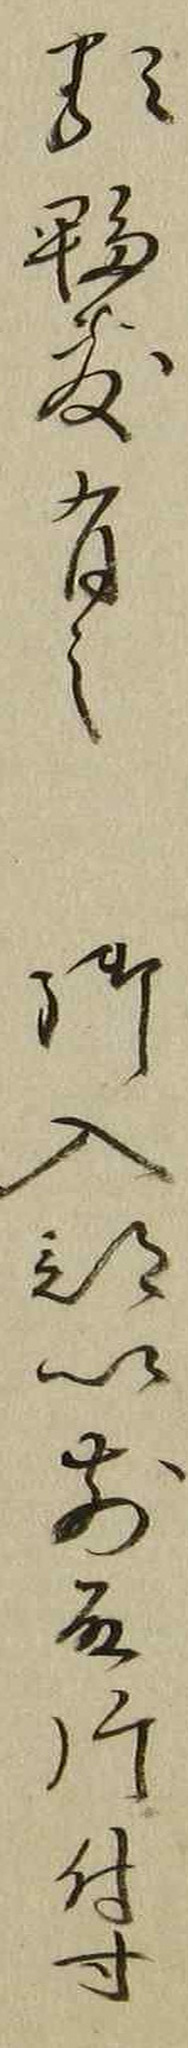類夥敷有之御入部以前取片付寸
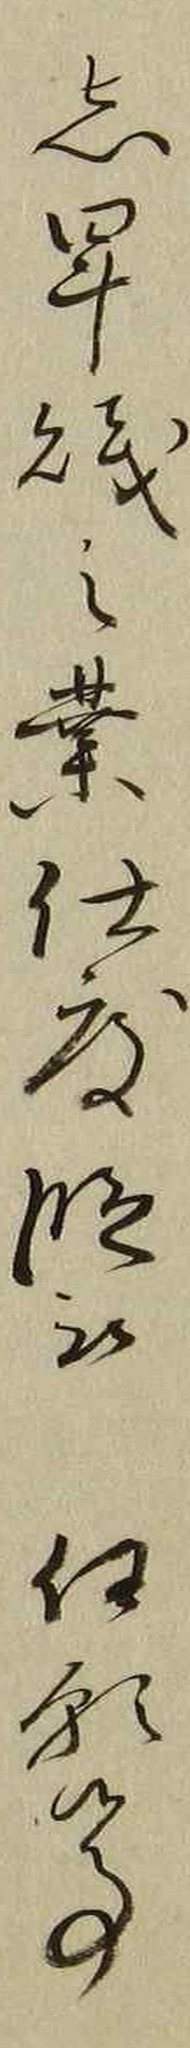志卑賎之業支度段被任願候事
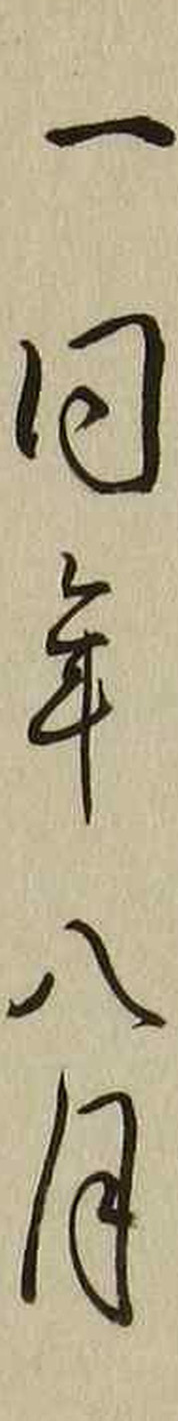一同年八月
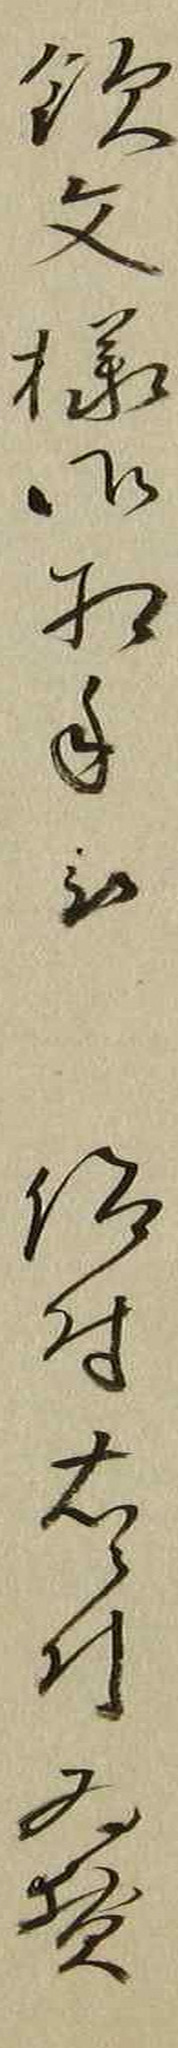欽文様御相手被仰付右に付為費
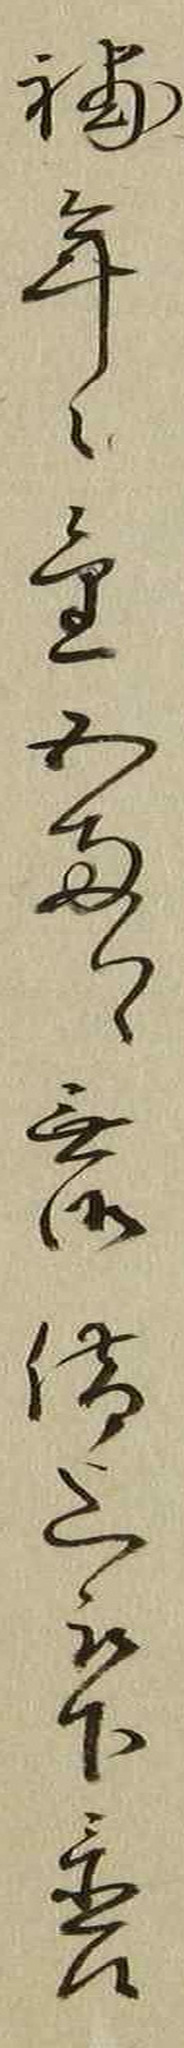補年々金五両ツヽ無御借上被下置候
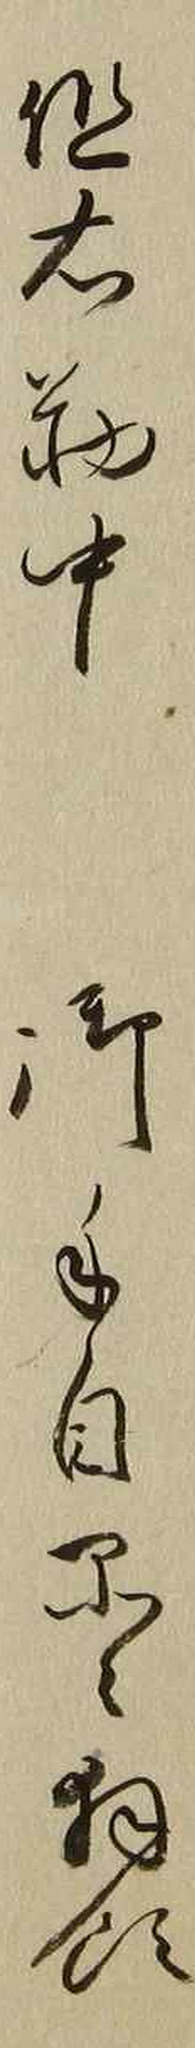但右勤中御手自品々拝領
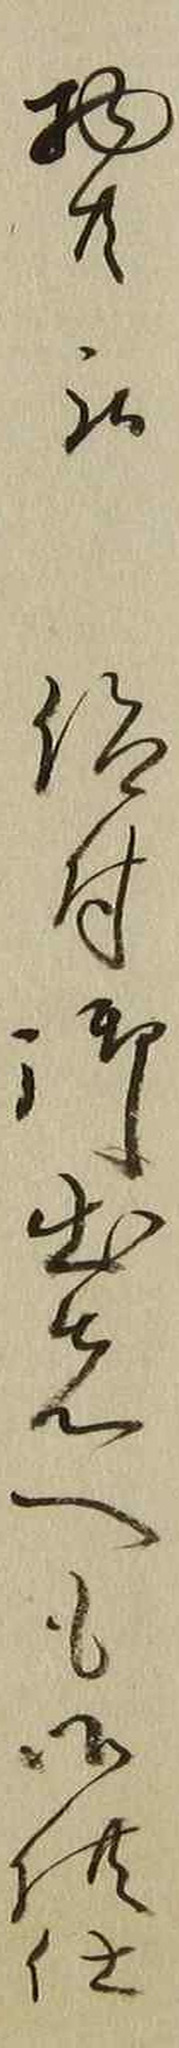物共被仰付御出先へも御供仕
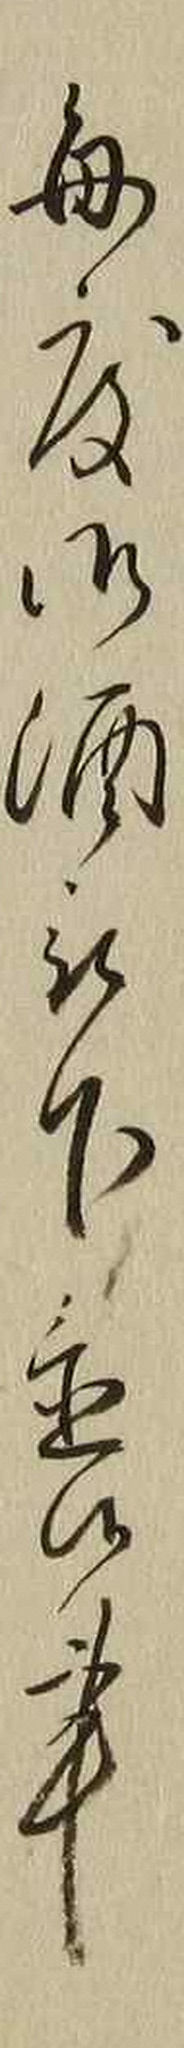毎度御酒被下置候事
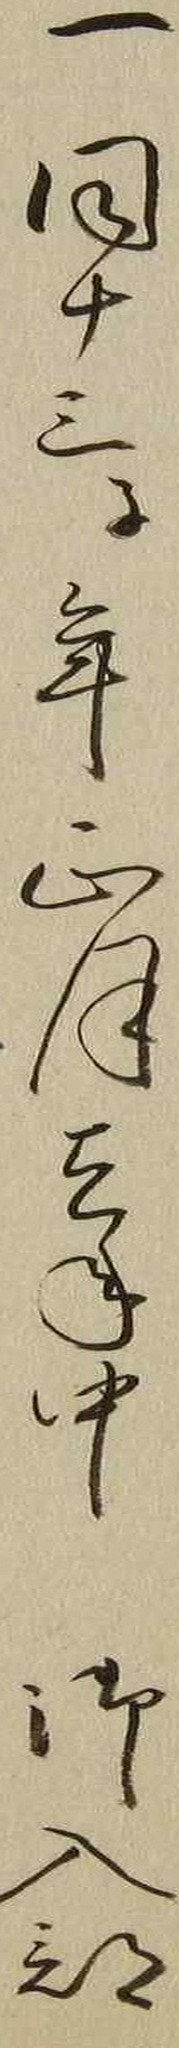一同十三子年正月去年中御入部
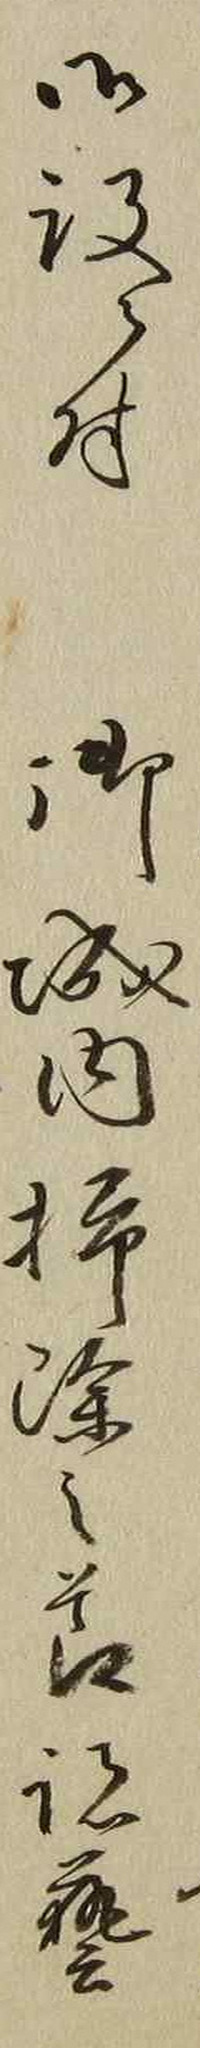御設に付御城内掃除之節諸芸
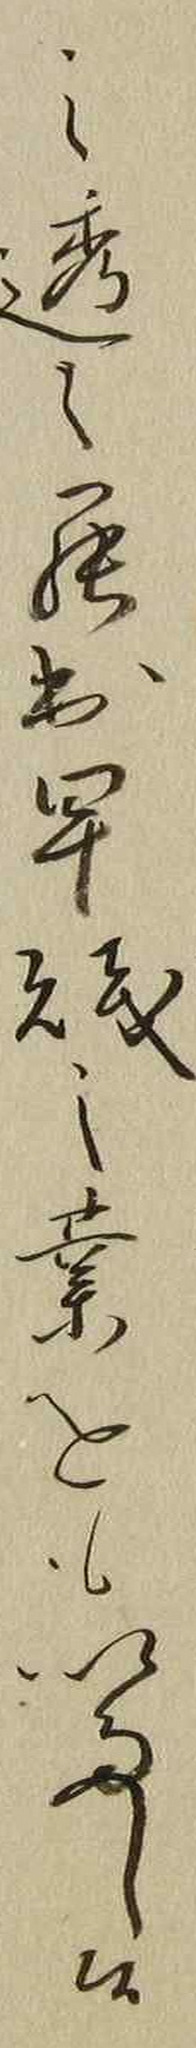之透し罷出卑賎之業をもいたし候
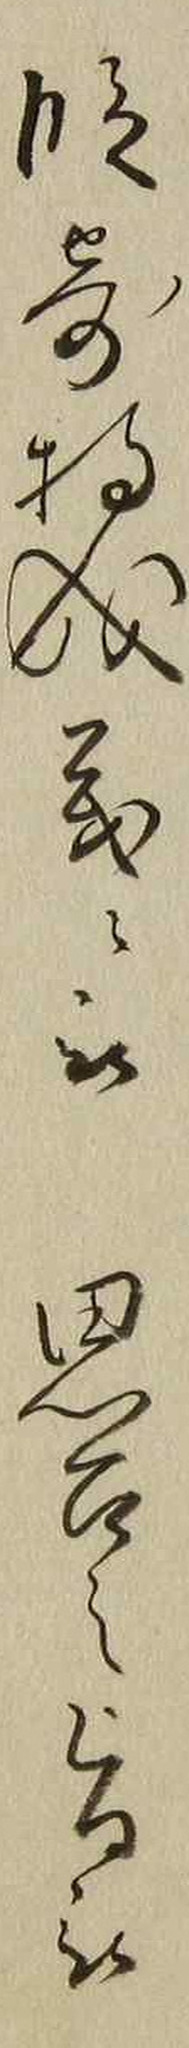段奇特成義に被思召之旨被
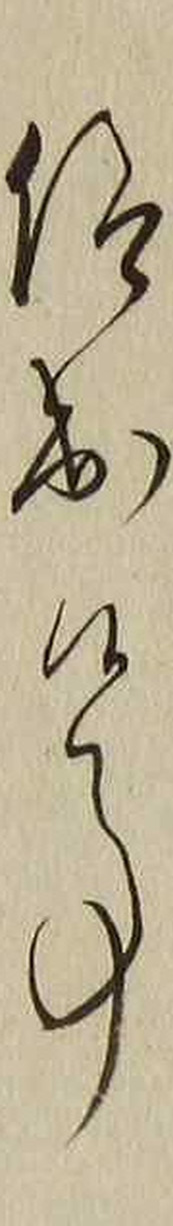仰出候事
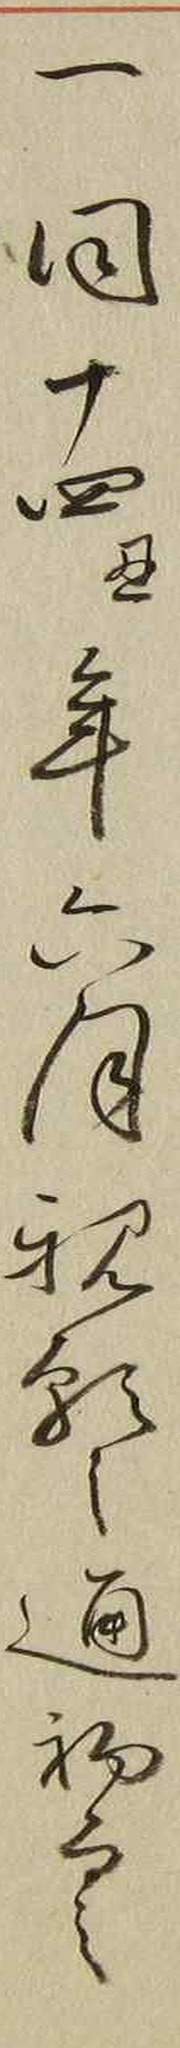一同十四丑年六月親願之通初而之
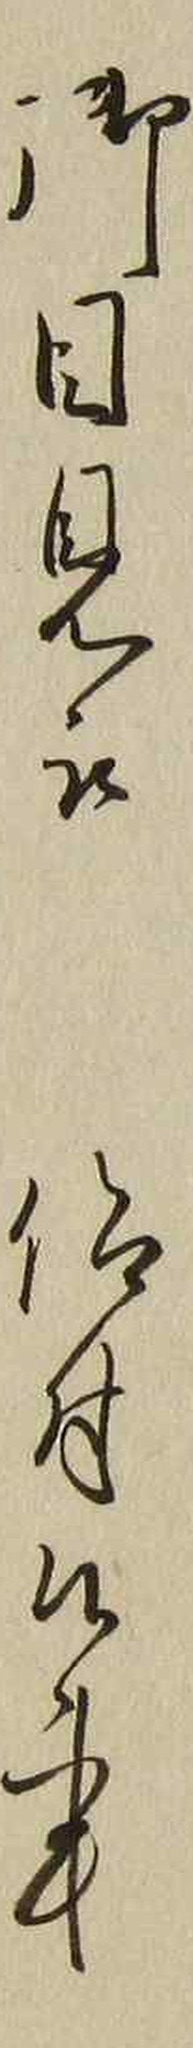御目見被仰付候事
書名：諸士系譜　巻之3　い之部3
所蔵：会津若松市立会津図書館
